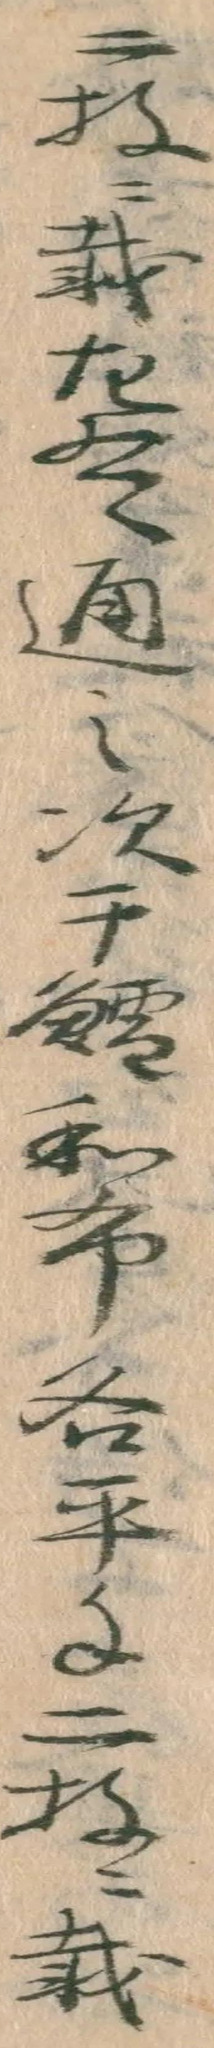二枚ニ載左右ヘ通也次干鱈和布各平手二枚ニ載
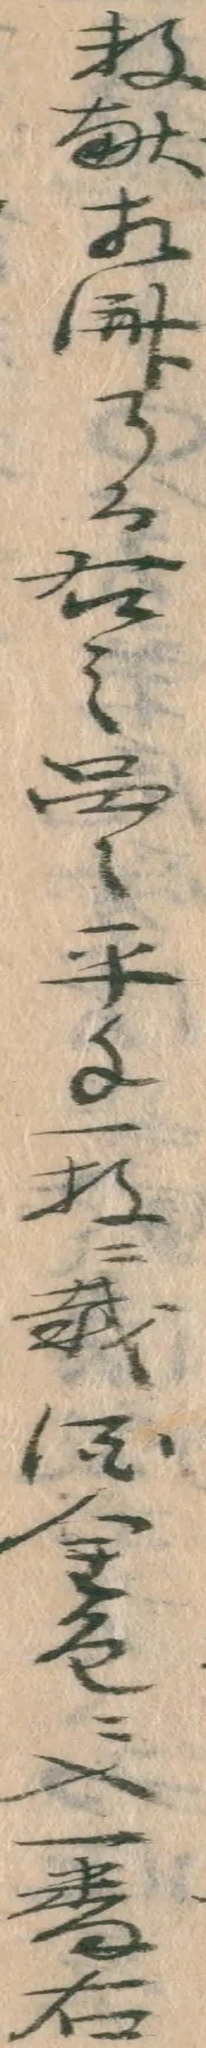数献相済了而右之品々平手一枚ニ載酒金色ニ入一番右
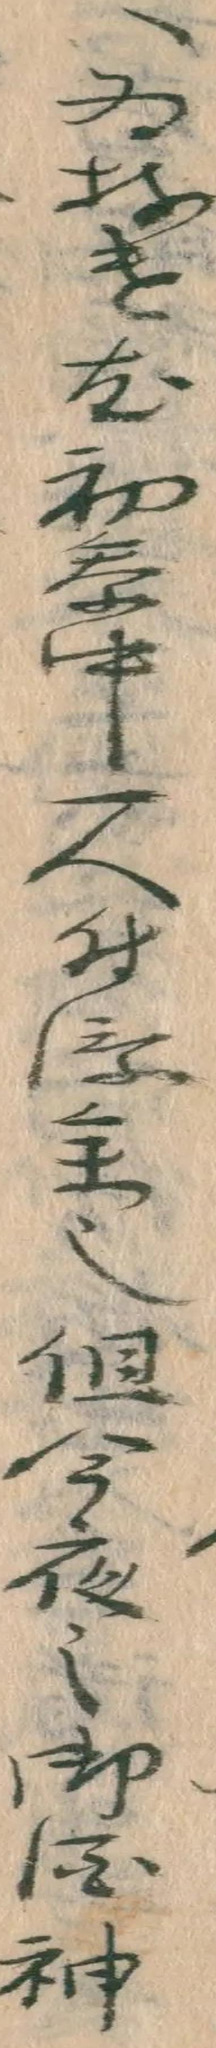へ為持遣尤初泰中一人付添参也但今夜之御酒神
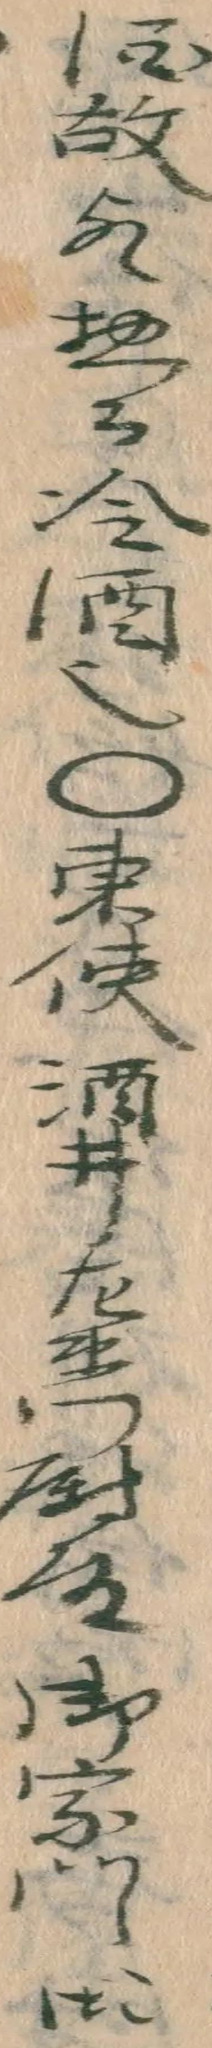酒故歟惣而冷酒也○東使酒井左衛門尉殿御家門御
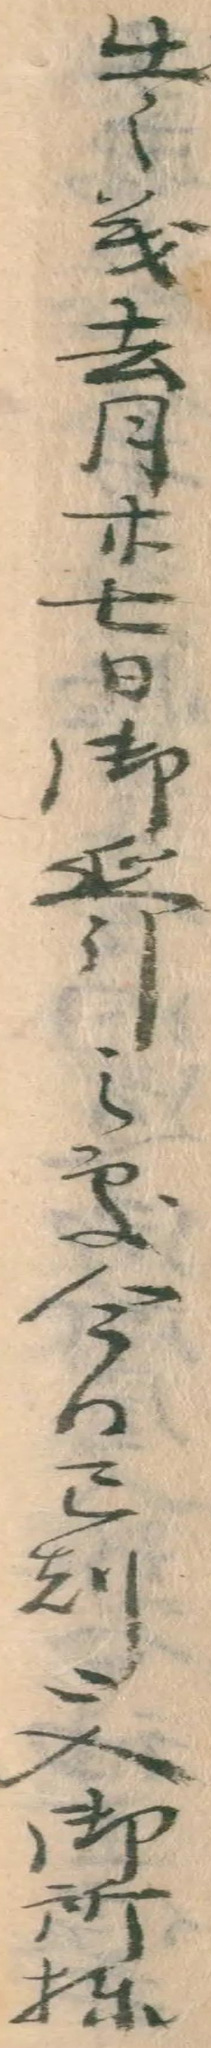出之義去月廿七日御延引之處今日巳刻御入御所様
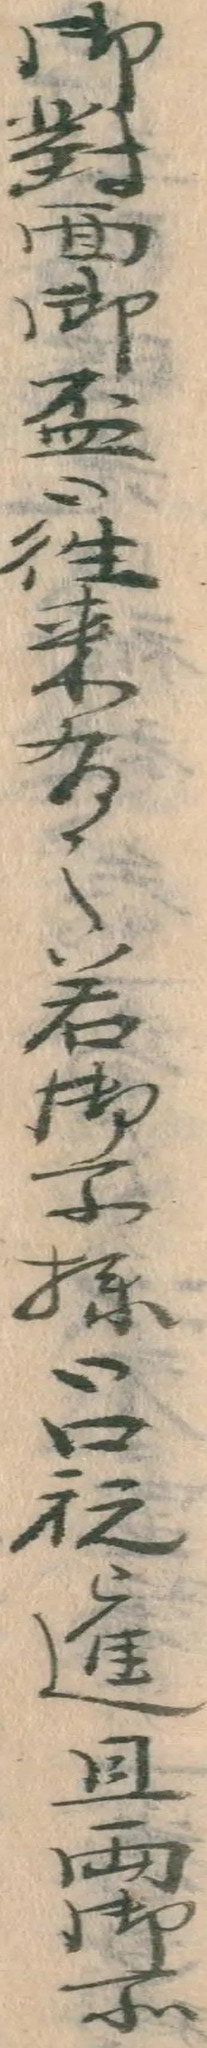御對面御盃御往来有之若御所様御口祝被進且両御所
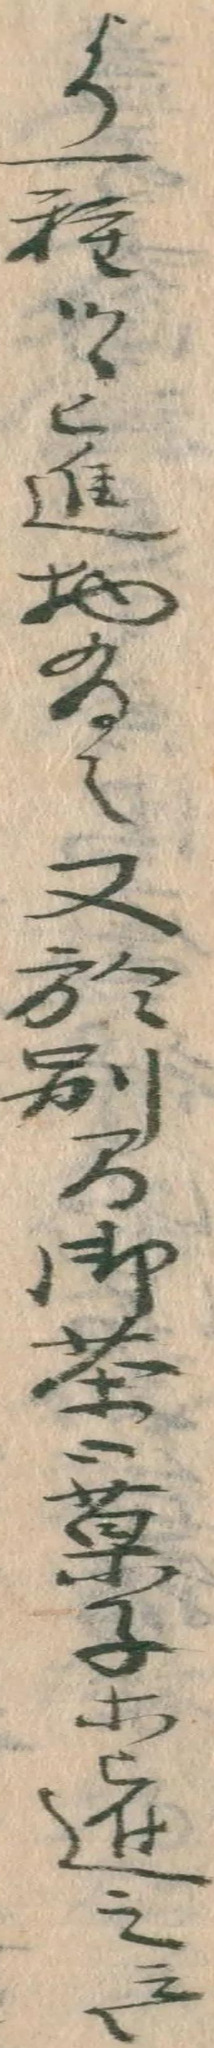より一種ツヽ被進物有之又於別間御茶御菓子等被進之云々
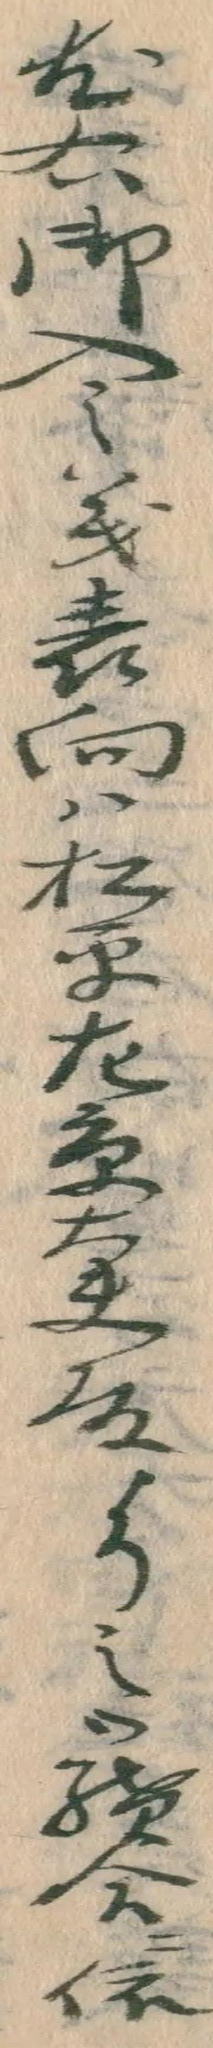尤右御入之義表向ハ松平左京大夫殿より之御続合ニ依
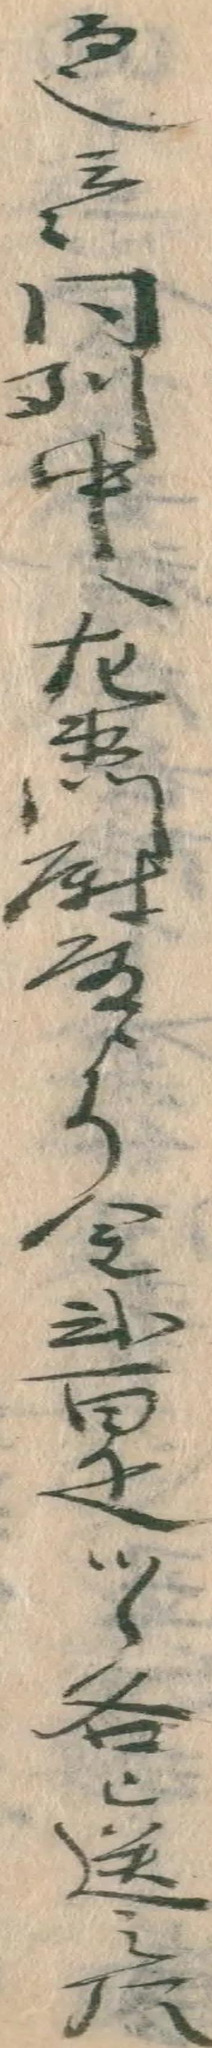而也云々同列中へ左衛門尉殿より金弐百疋ツヽ各被送之頂
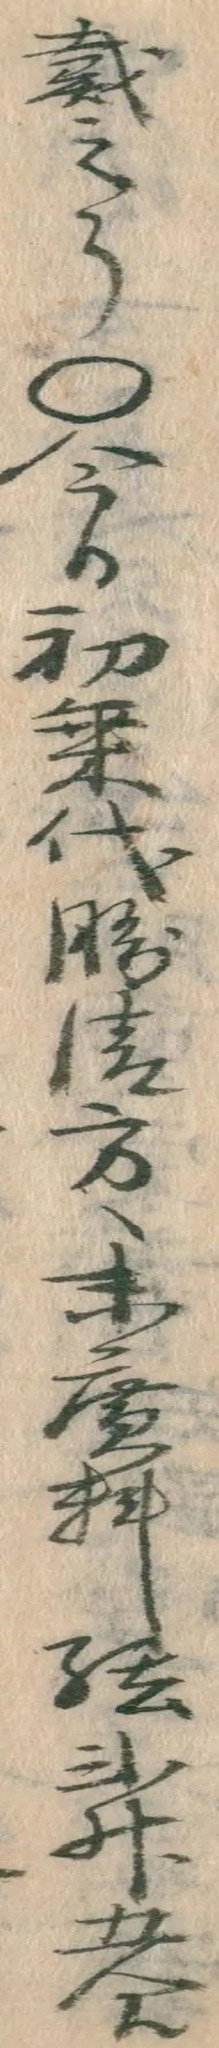戴之了○今日初菜代勝清方へ末廣料弦弐升五合
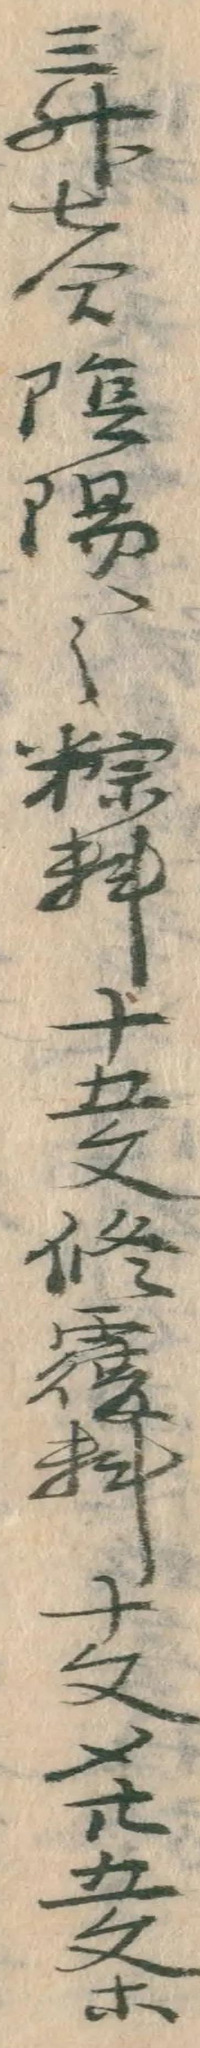三升七合陰陽へ之粽料十五文修覆料十文〆廿五文等
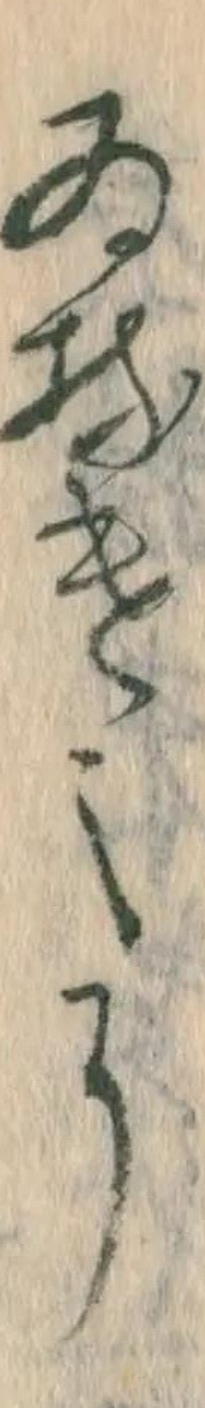為持遣之了
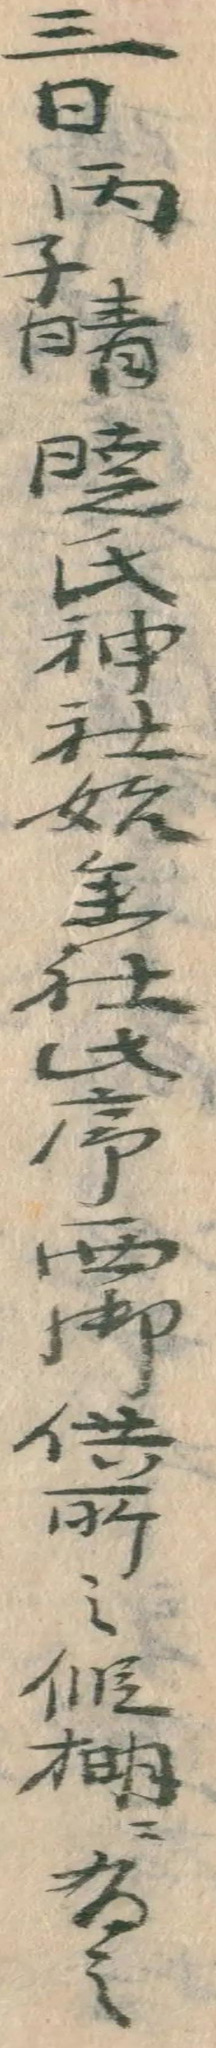三日丙子晴暁氏神社始参社此序西御供所之仮棚ニ有之
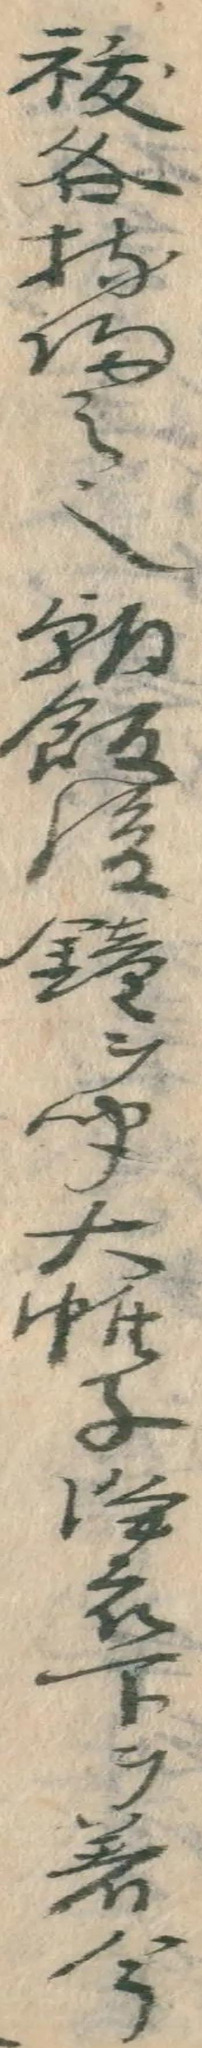祓各持帰之也朝飯後鐘ヲ聞大帷子浄衣下ヲ着今
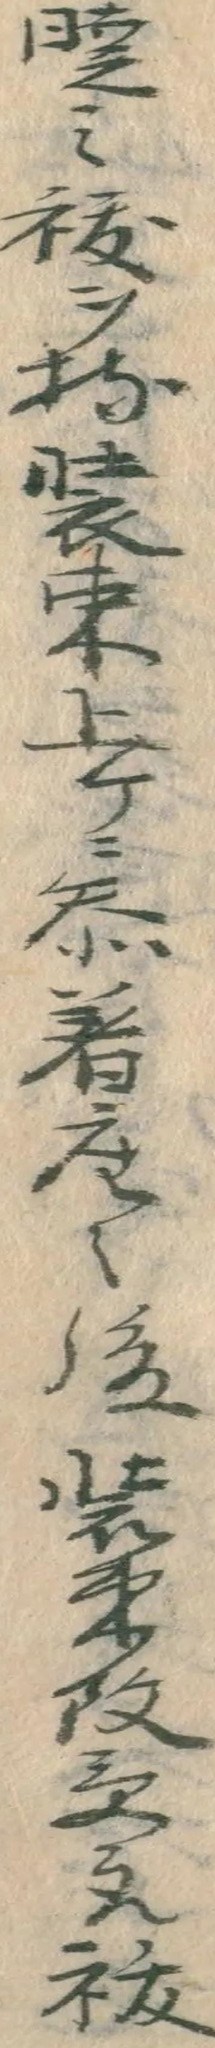暁之祓ヲ持装束上ケニ参着座之後装束改受取祓
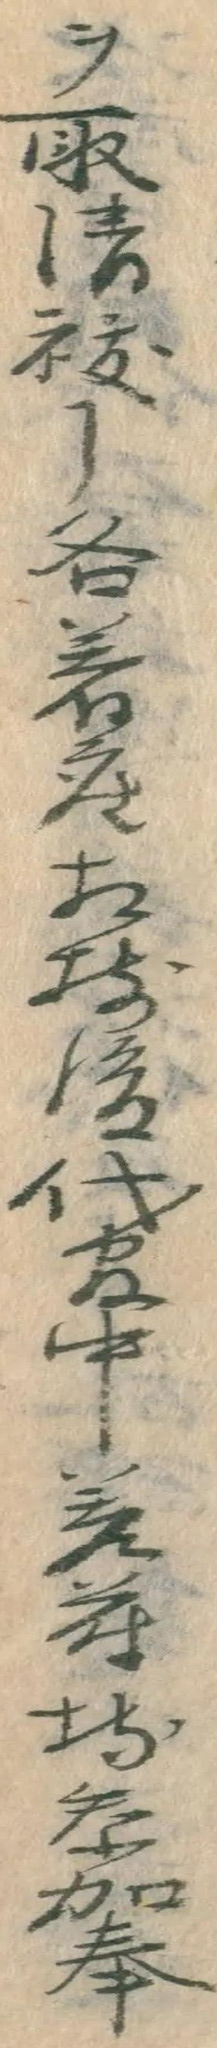ヲ取清祓了各着座相揃後代官中差府持参加奉
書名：賀茂社記録. 第63冊
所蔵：国立国会図書館 National Diet Library, JAPAN
